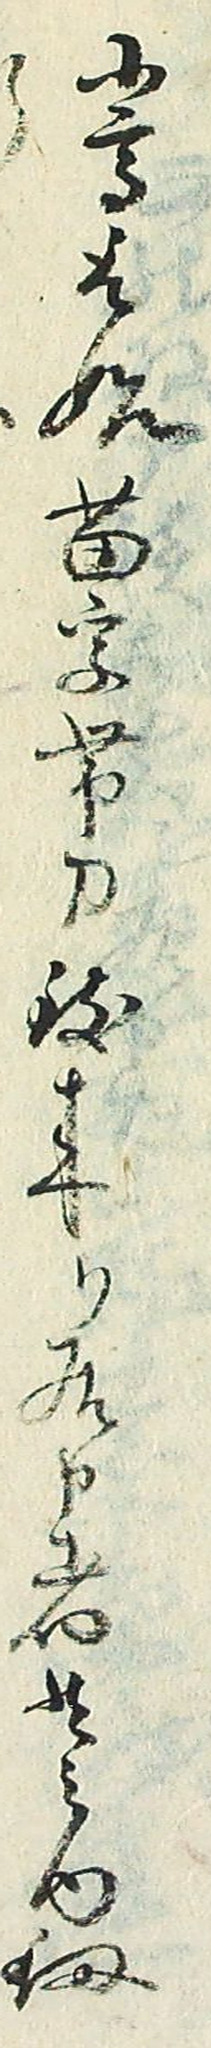小高取始苗字帯刀致来り居申者共之内釼
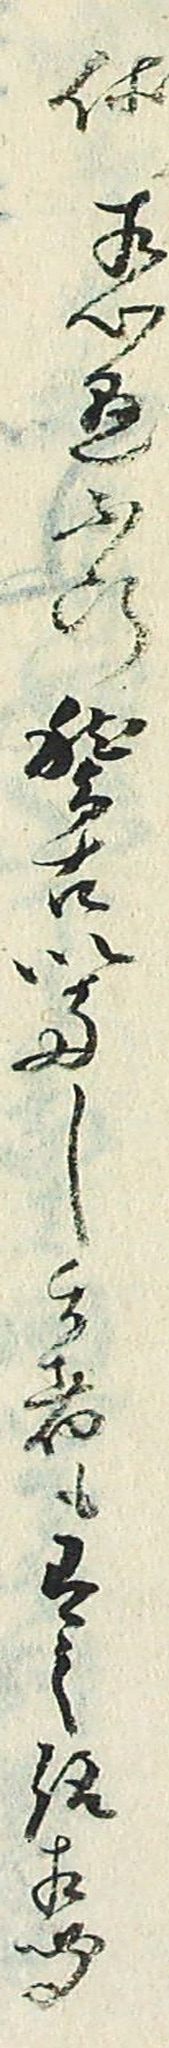術相心懸不断稽古いたし候者も有之趣相聞
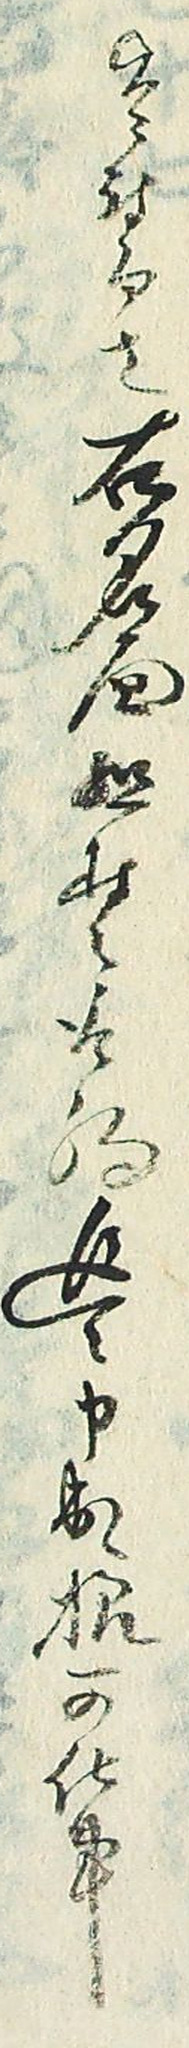候ニ付而者右名面組村々取約追々申出候様可仕事
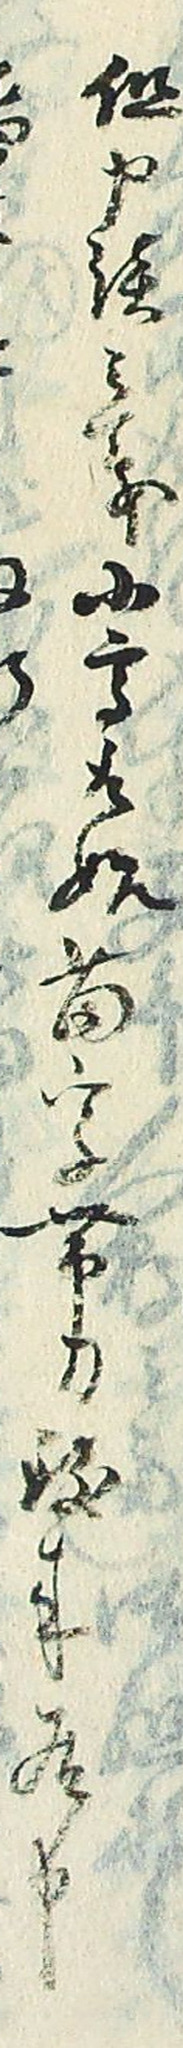但申談之義小高取始苗字帯刀致来居申
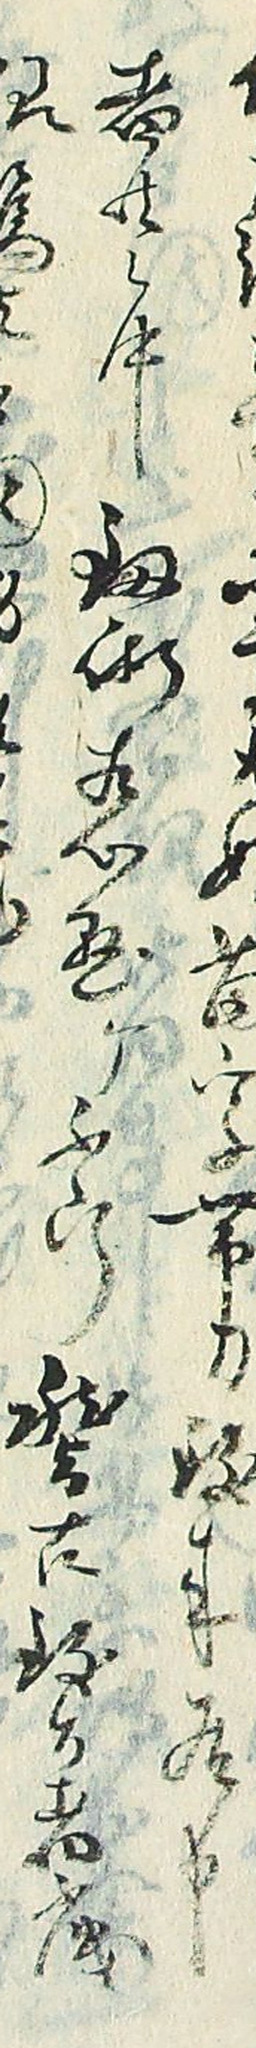者共之中釼術相心懸ケ不断稽古致候者不洩
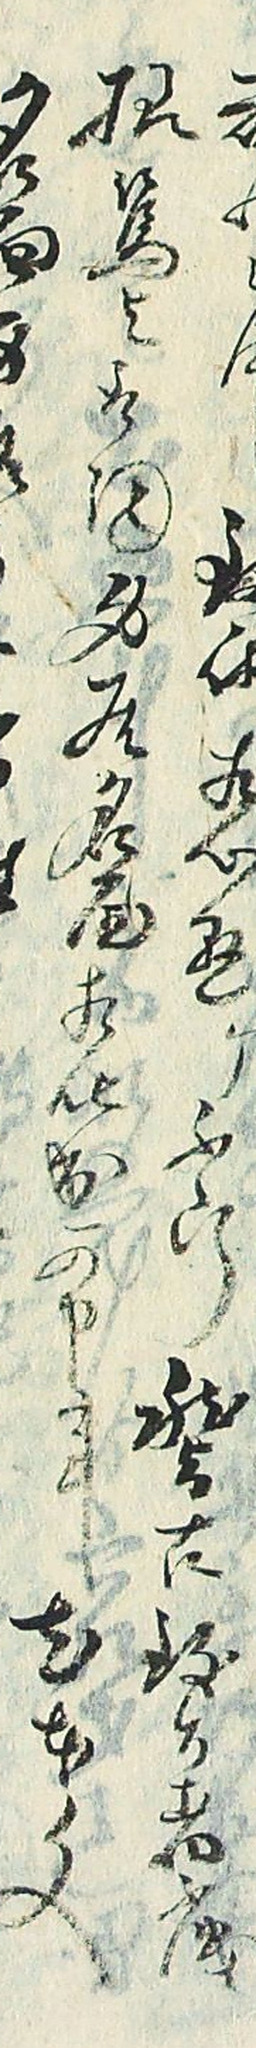様篤と取調身居名面相仕出可申事尤本文
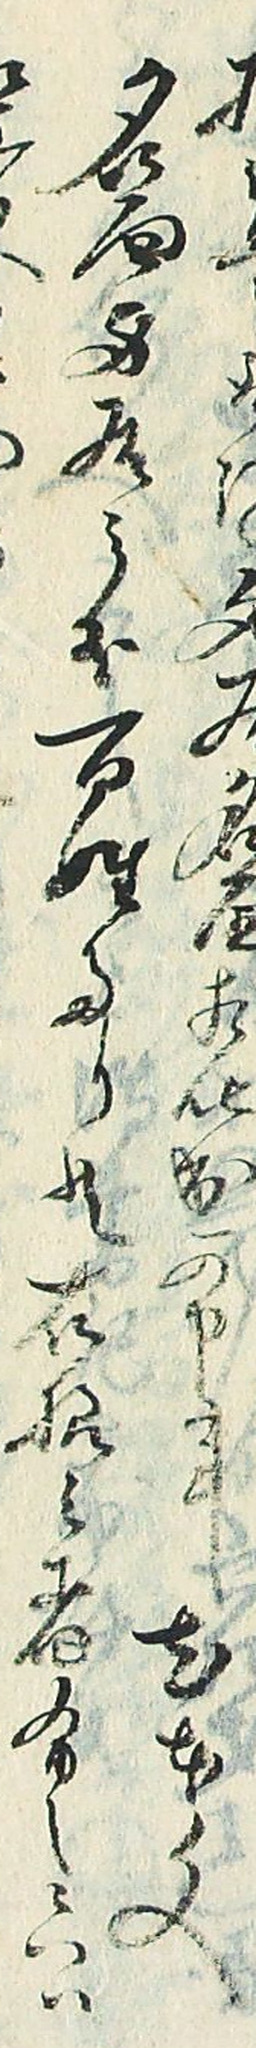名面身居之外百姓たり共右様之者有之候ハハ
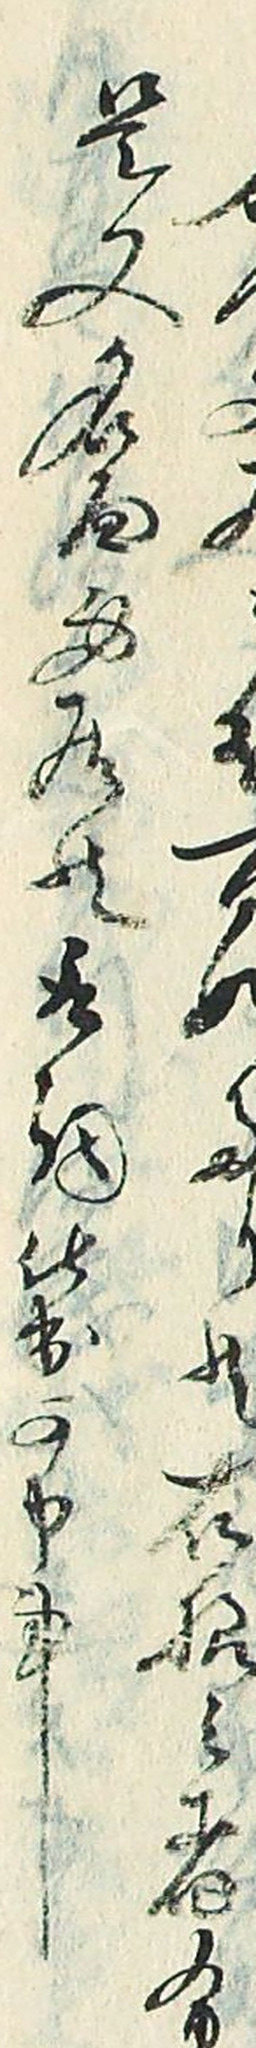是又名面身居共取調仕出可申事

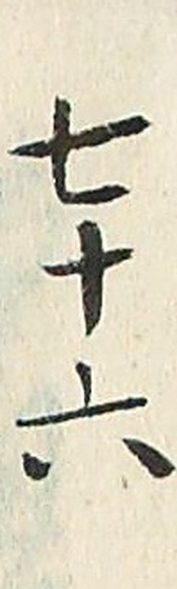七十七
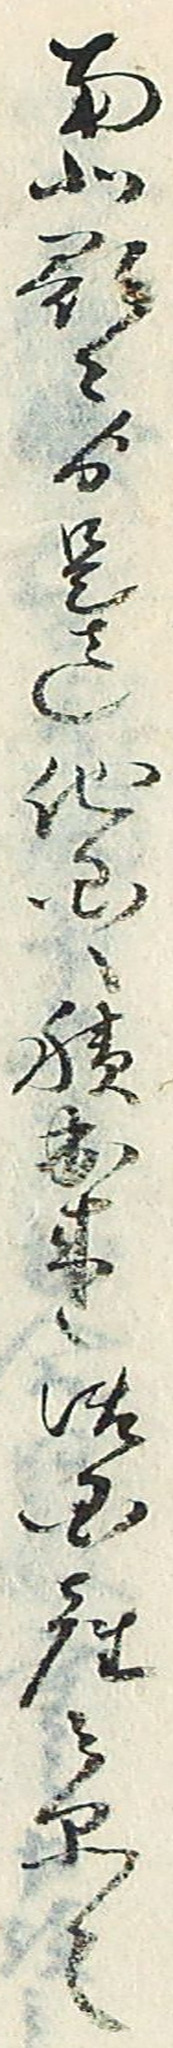南北郡々ゟ是迄他国へ積出来候御国産之品々
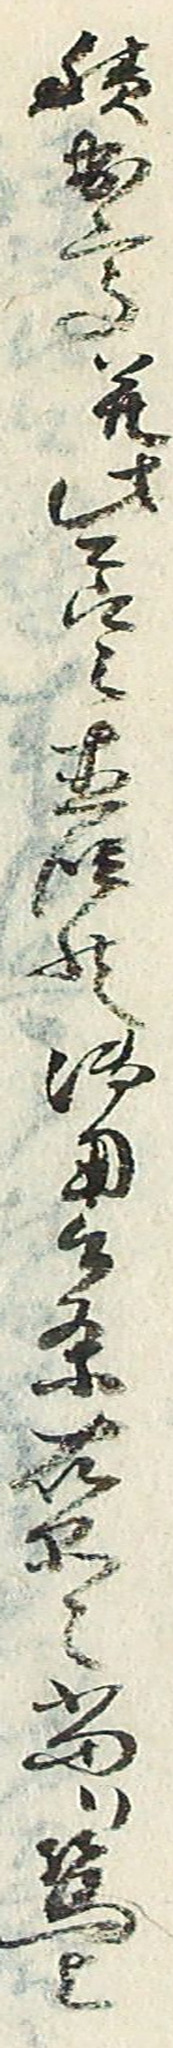積出高幷此節之直段共御用候条右品々當り篤と
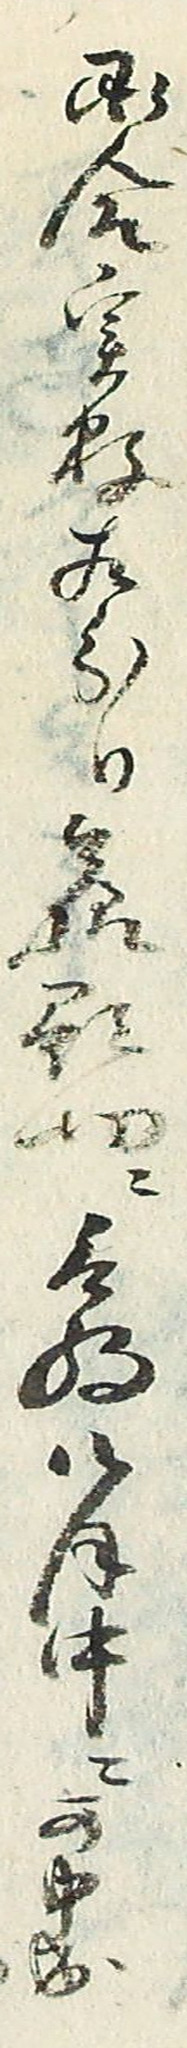承合実数相分り候様郡切ニ取約八月中ニ可申出事
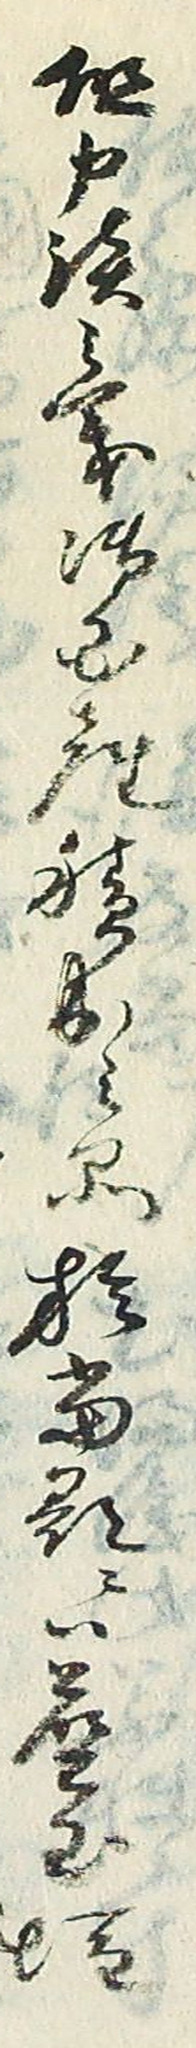但申談之義御国産積出之品於當郡ニハ藍玉塩
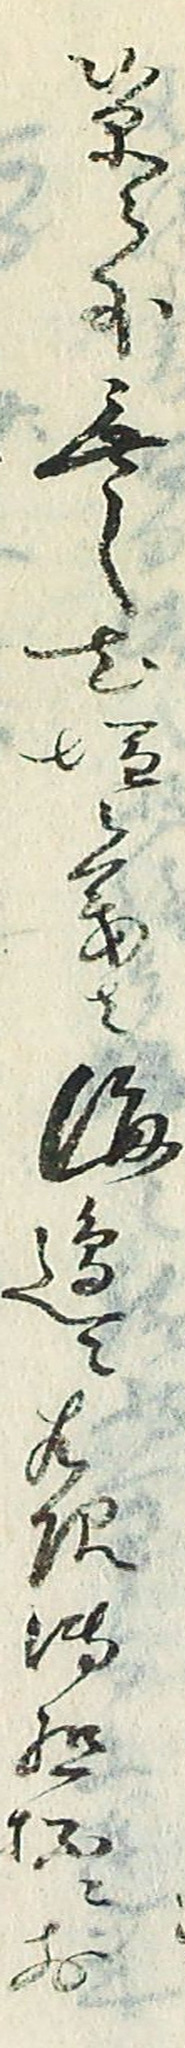弐品之外無之尤塩之義者海邊ニ相限御組抔ニお
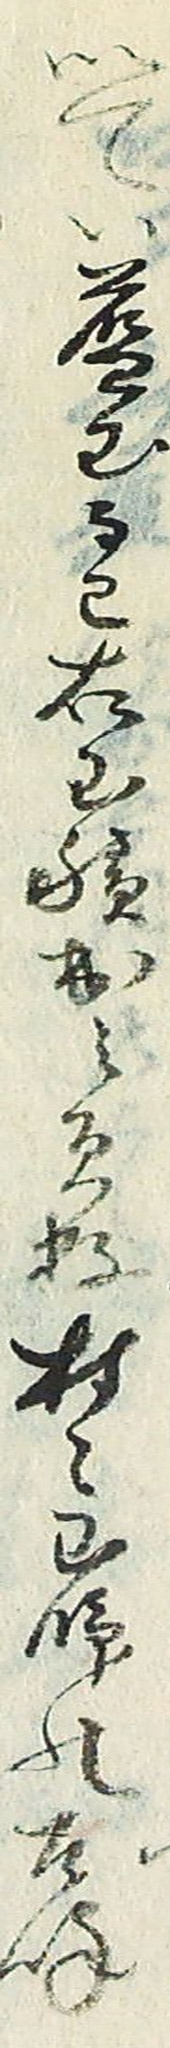いてハ藍玉而已右玉積出之員数村々玉師共召呼
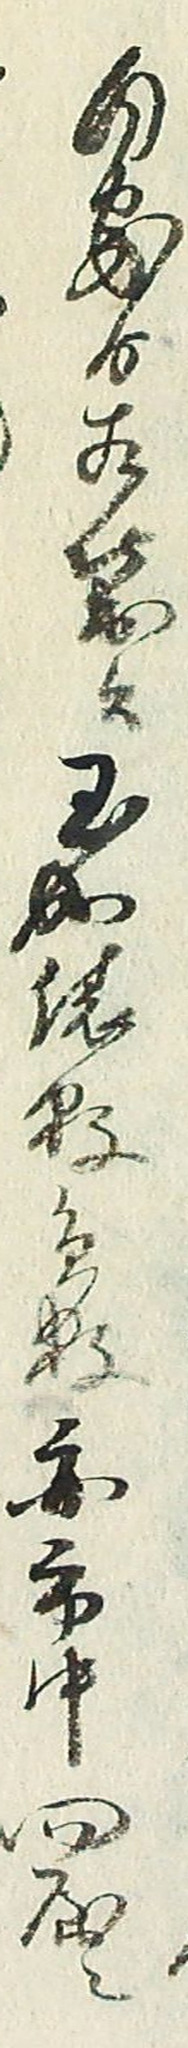自宅ゟ相仕出候玉成俵数員数亦市中問屋ニ
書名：諸御趣意書并御下知向之写
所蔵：鳴門教育大学 Naruto University of Education
